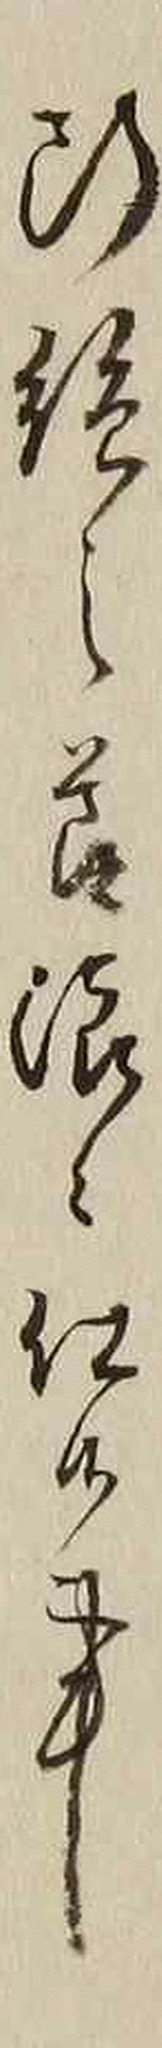断絶之節浪々仕候事
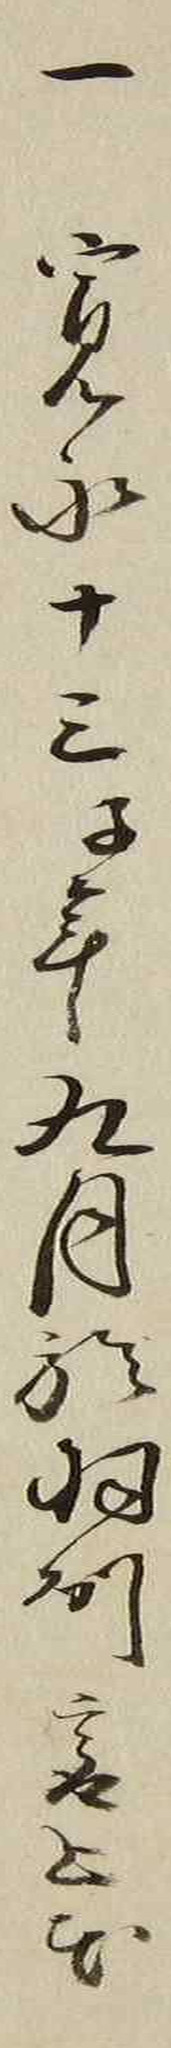一寛永十三子年九月於羽州最上本
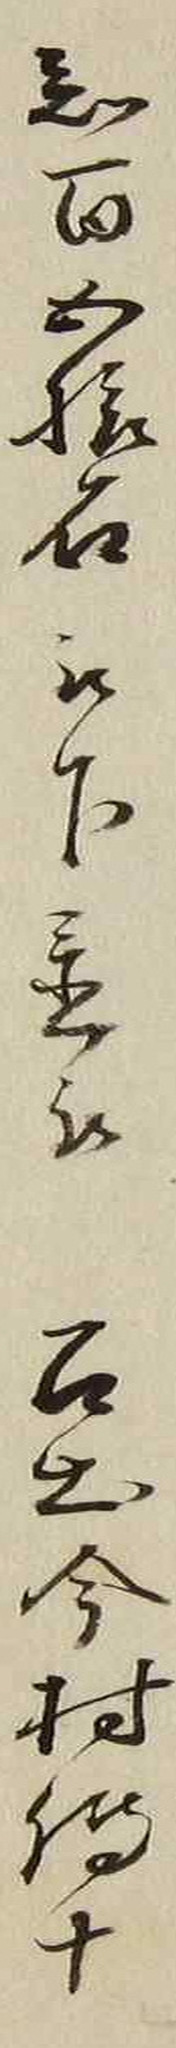知百五十石被下置候召出今村伝十
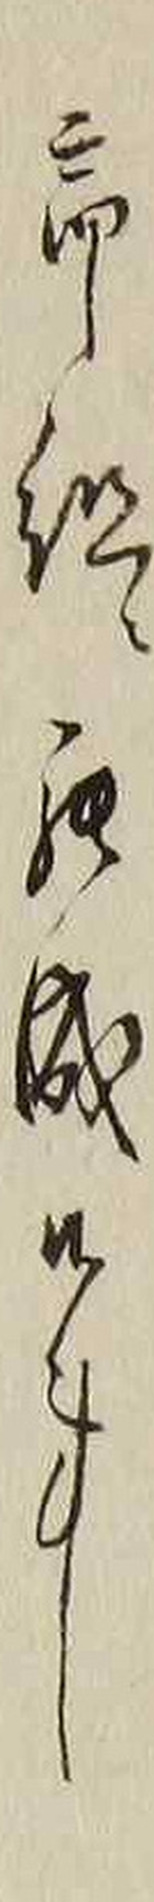郎組に罷成候事
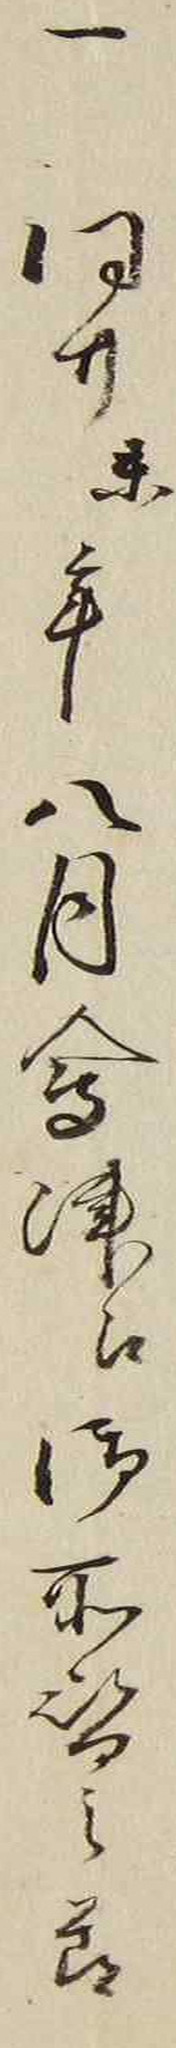一同廿未年八月会津へ御所替之節
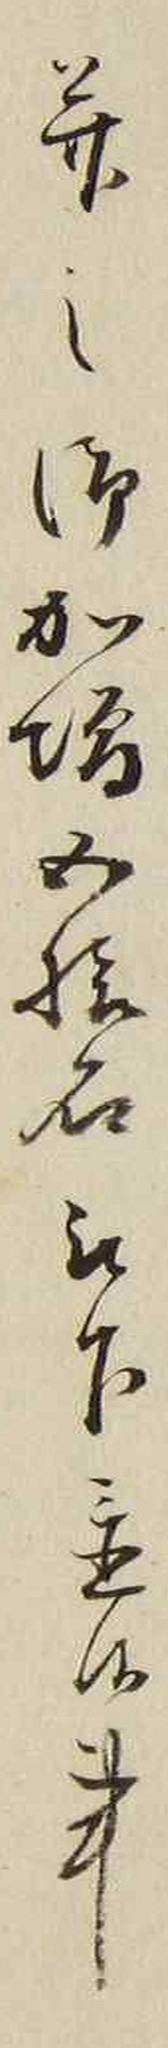併之御加増五十石被下置候事

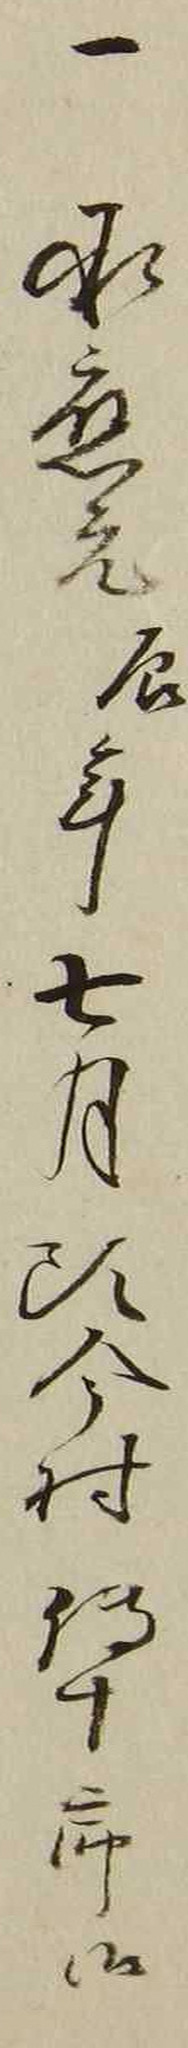一承応元辰年七月頭今村伝十郎御
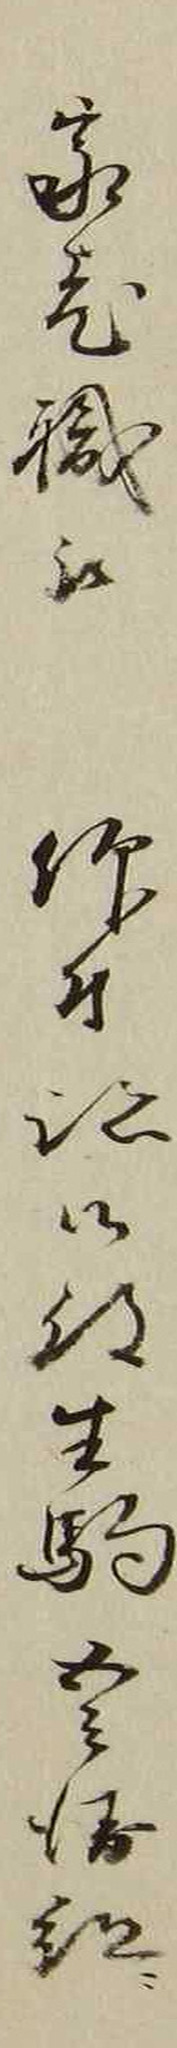家老職被仰付跡御役生駒五三郎組に
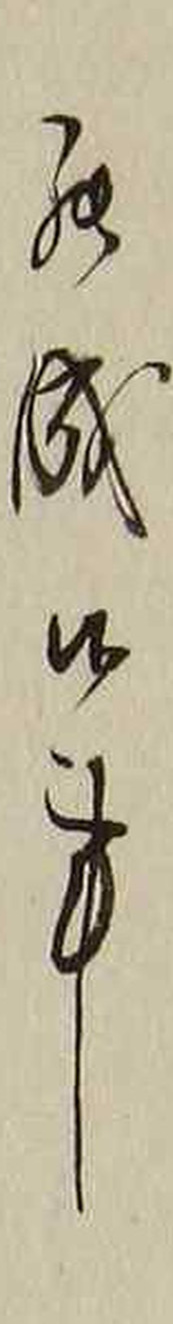罷成候事
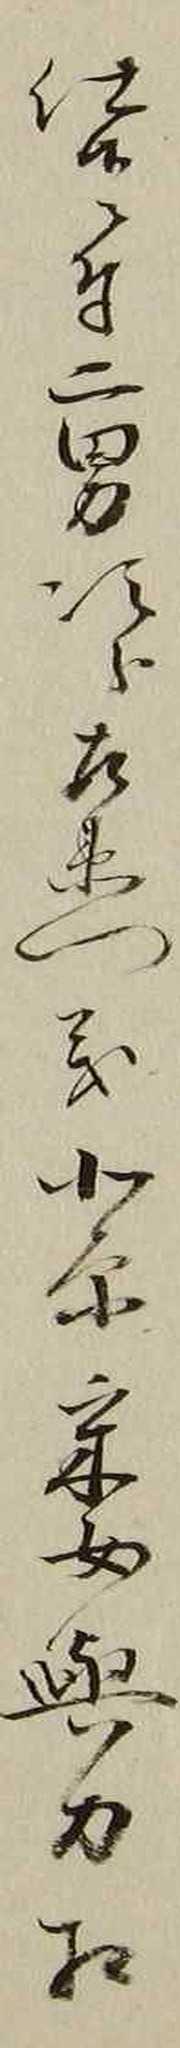仕候に付二男次郎左衛門義北原采女与力相
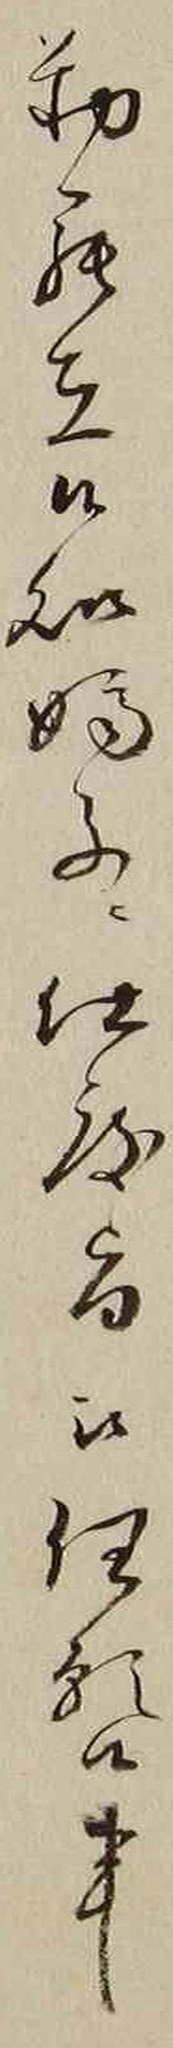勤罷在候処嫡子に仕度旨被任願候事
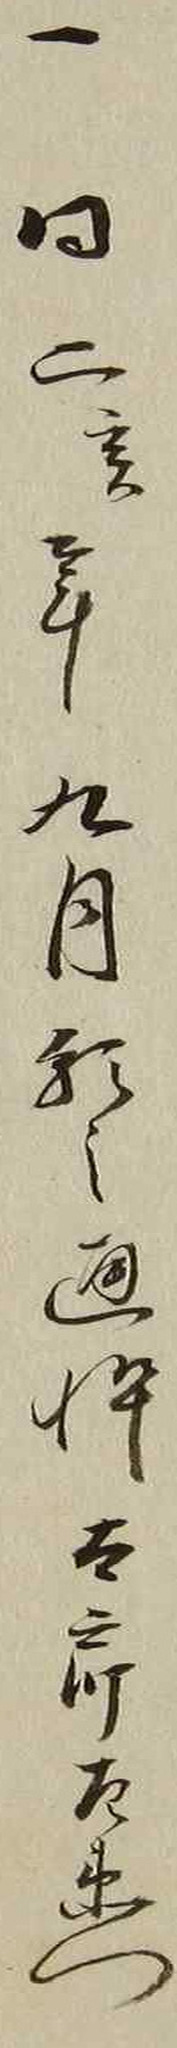一同二亥年九月願之通伜太郎左衛門
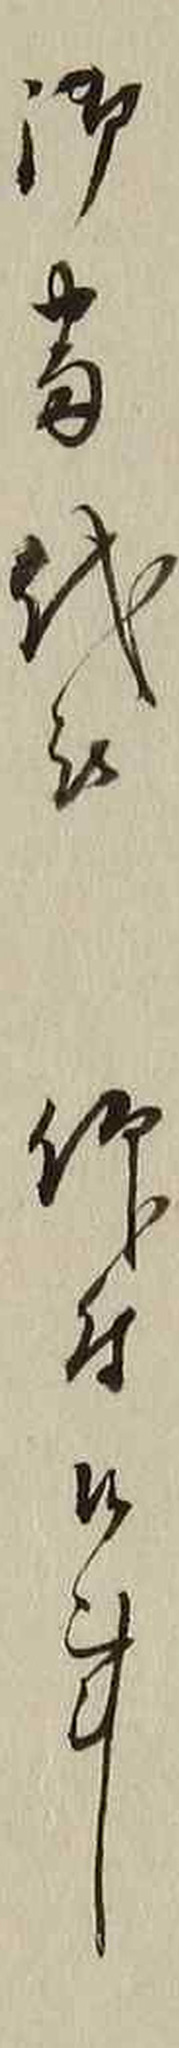御番代被仰付候事
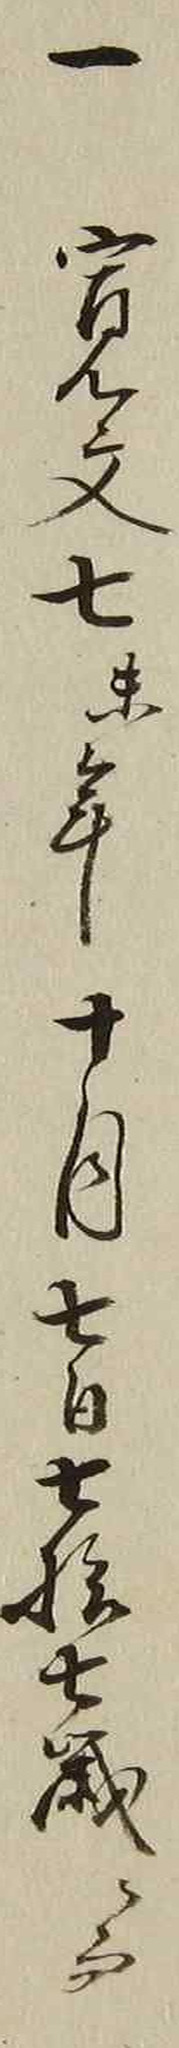一寛文七未年十月七日七十七歳にて
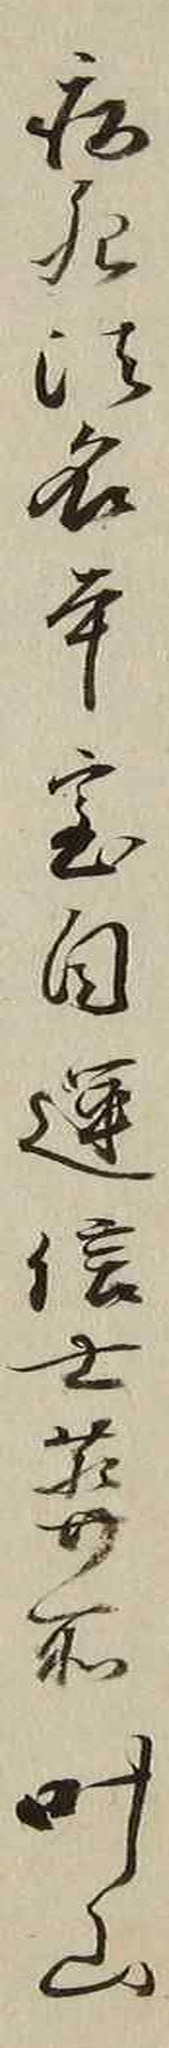病死法名本自運信士葬所叶山
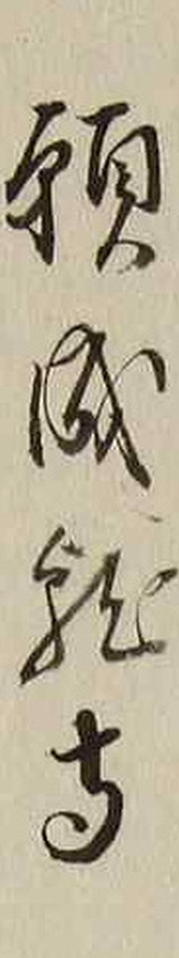願成就寺
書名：諸士系譜　巻之170　な之部12
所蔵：会津若松市立会津図書館
